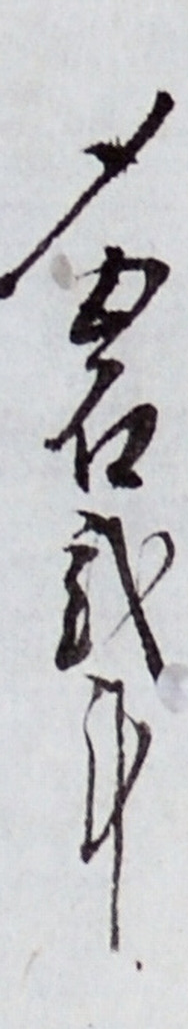〆五石弐斗
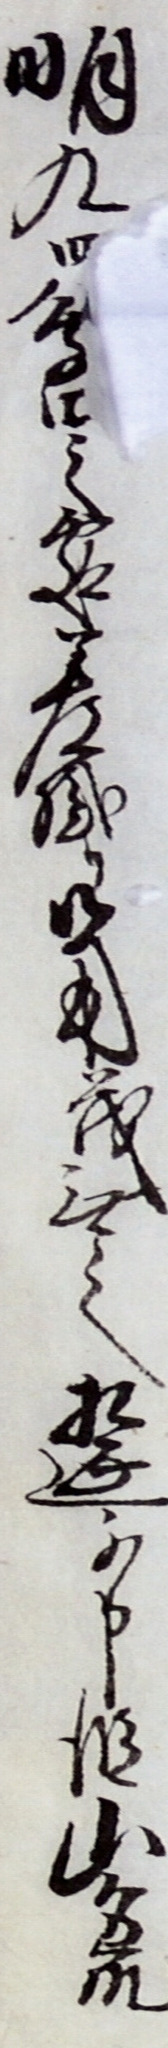一明九日聞仕候之処差掛り御用も無之相通可申段山方衆

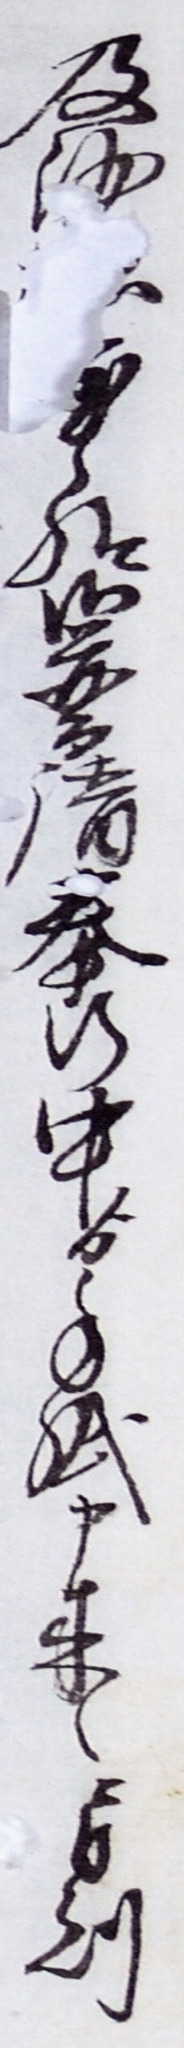及沙候様御普請奉行中ゟ手紙申来候ニ付則
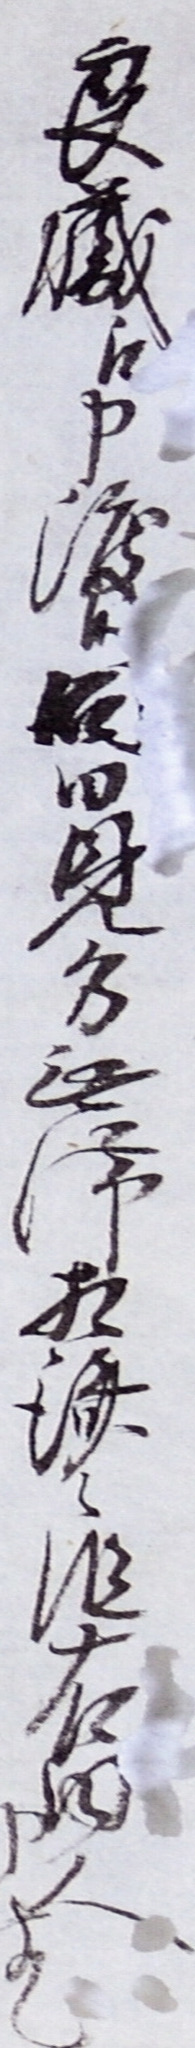良蔵江申渡候同日見分無滞相済之段右用人申聞候
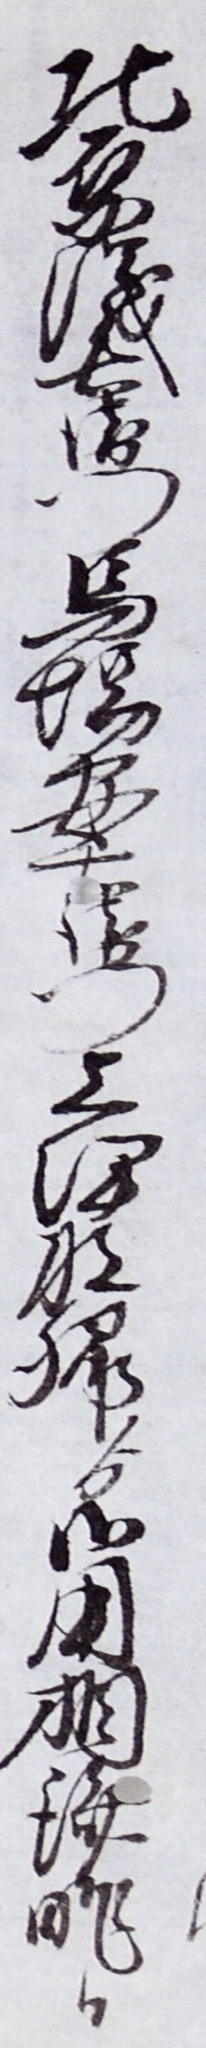一北原儀右衛門馬場安右衛門上伊那郷ゟ御用相済昨日
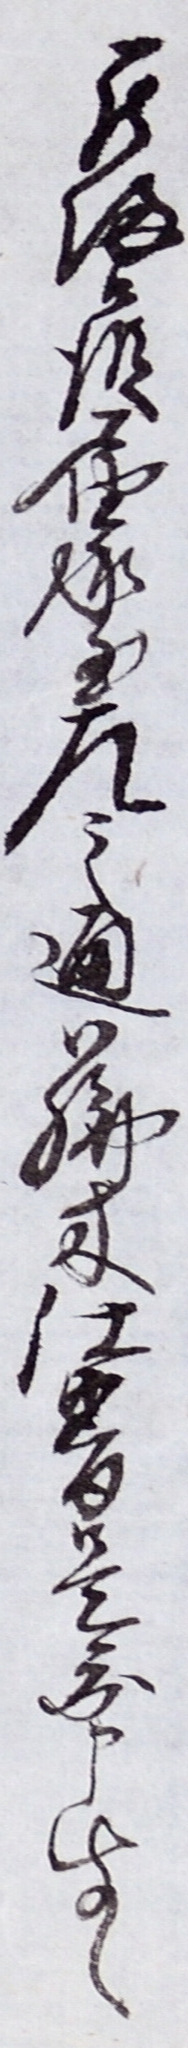罷帰候段届承置左之通御払木仕候旨是亦申聞候
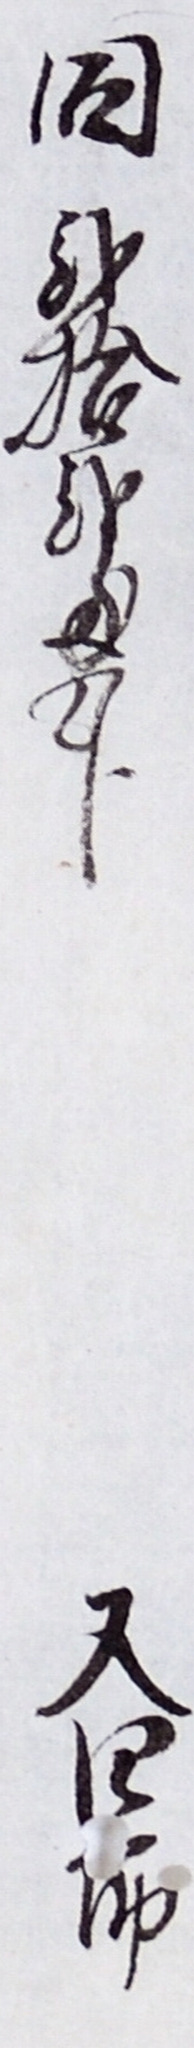同弐拾弐匁五分又四郎
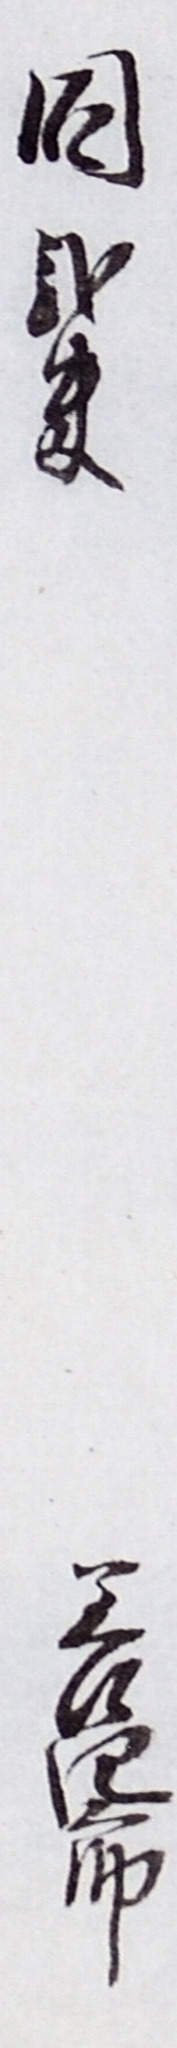同弐朱善四郎
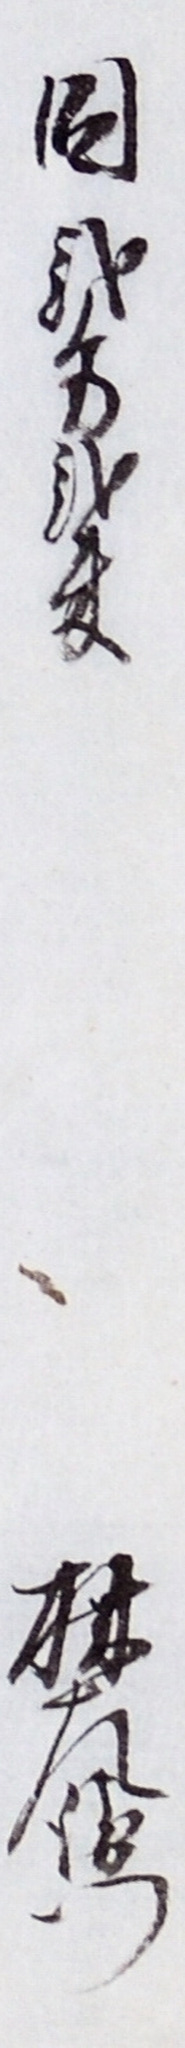同弐分弐朱林左衛門
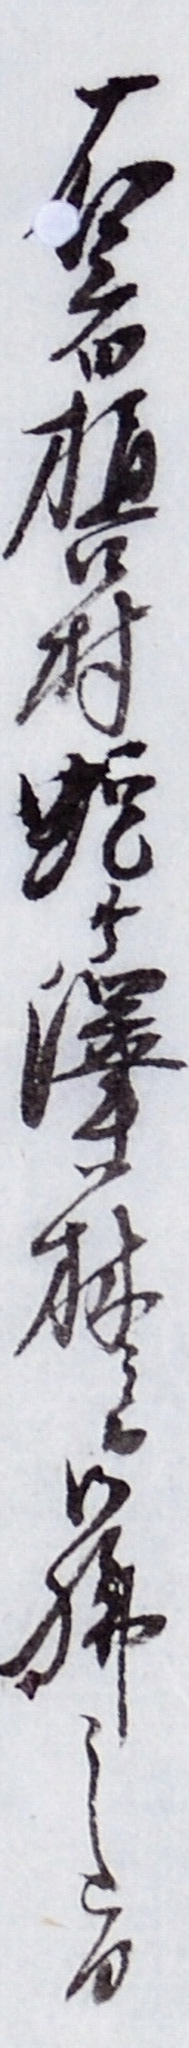右は樋口村蛇ケ澤御林ニ而御払之旨
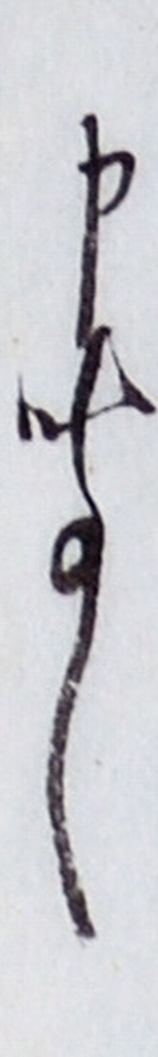申聞候
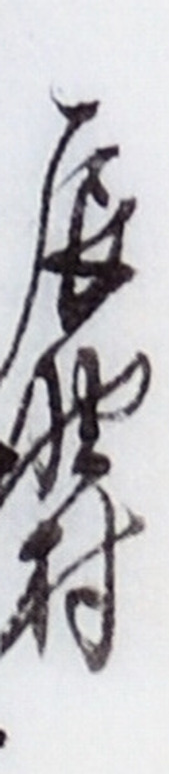辰野村
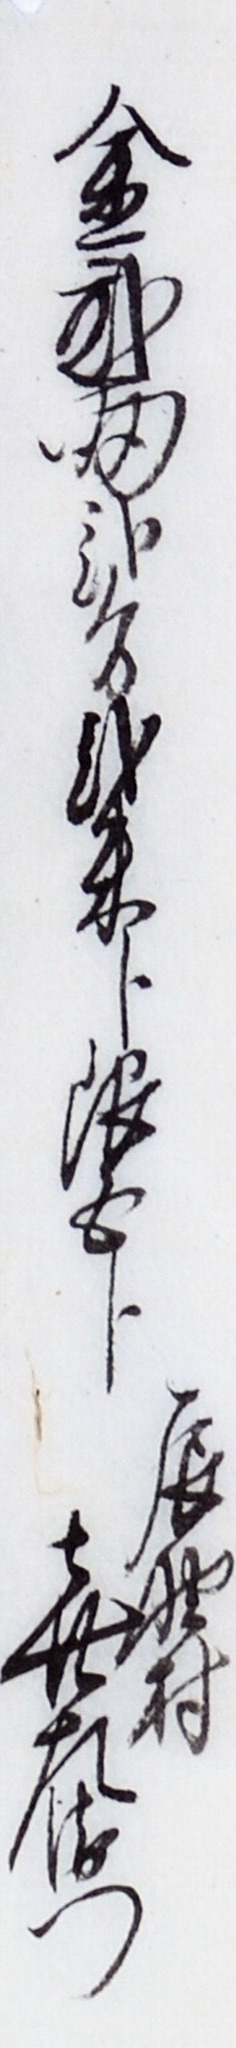金弐両弐分弐朱ト銀五分喜左衛門
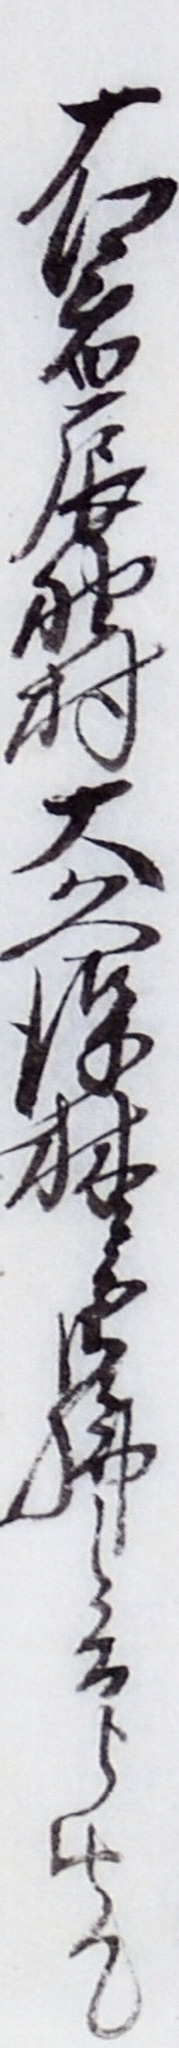右は辰野村大久保林ニ而御払之旨申聞候
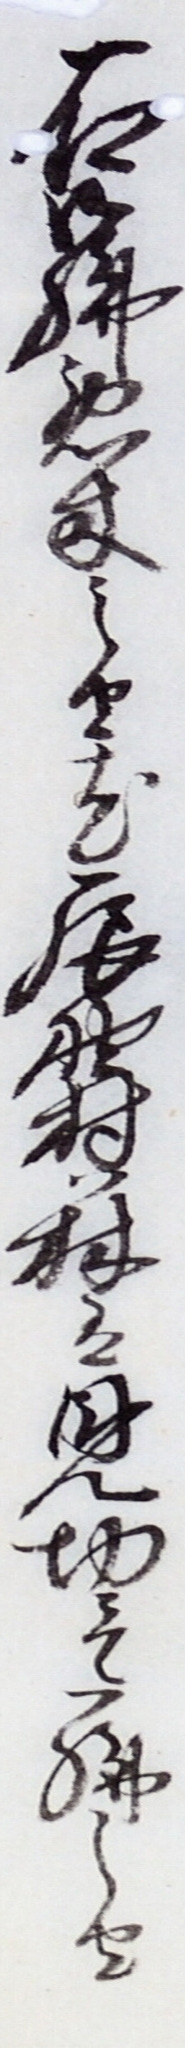右御払悪木之由尤辰野村御林は見切にて御払之由
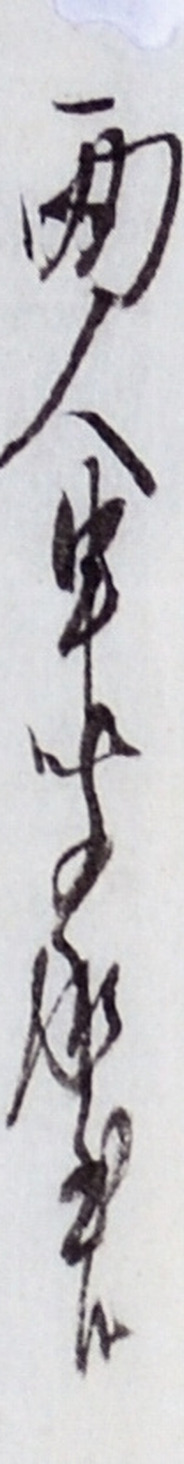両人申聞承置候
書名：御山奉行御用控
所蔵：伊那市立高遠町図書館・合同会社AMANE
